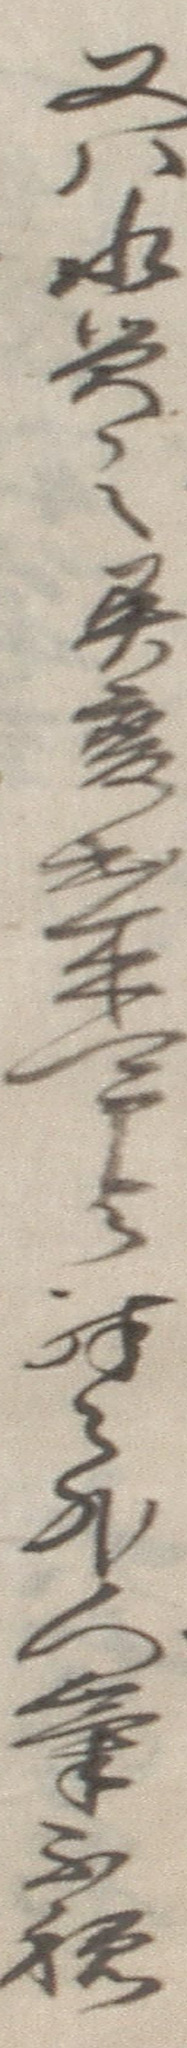又ハ水災之異変出来可申と殊之外人気不穏
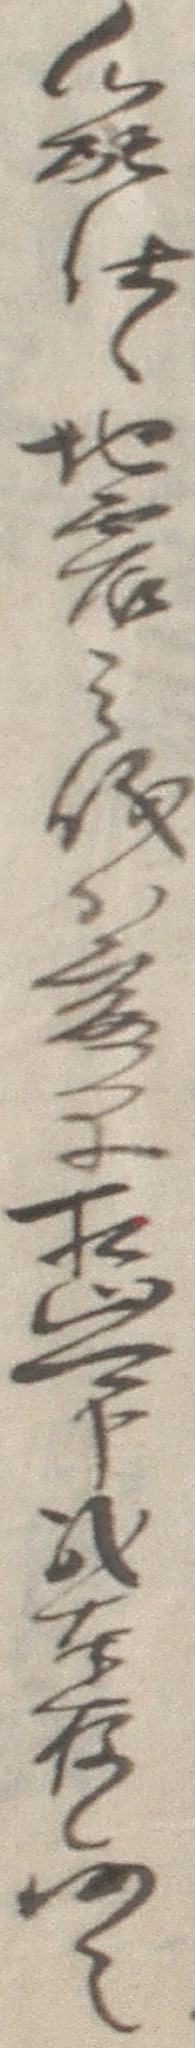心配仕候地震之儀ハ最早相止可哉奉存候仍之
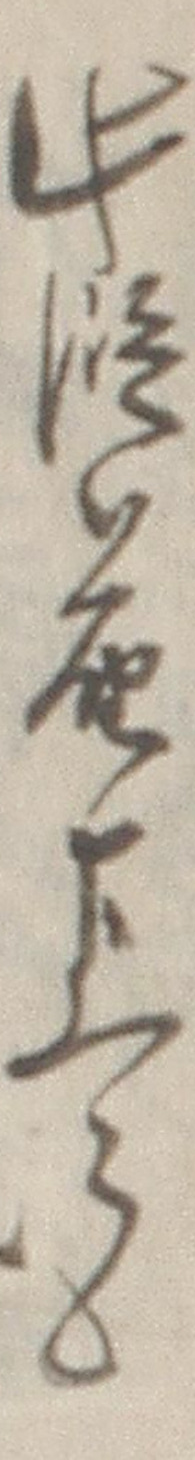此段御届申上候以上
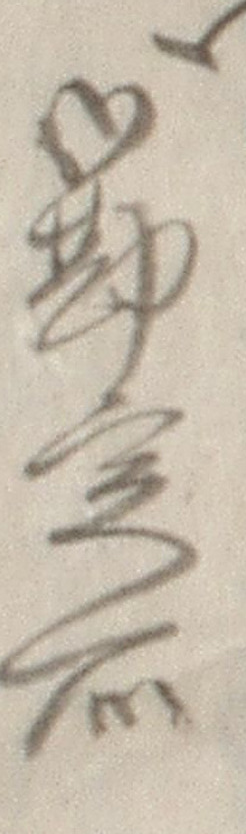御勘定所
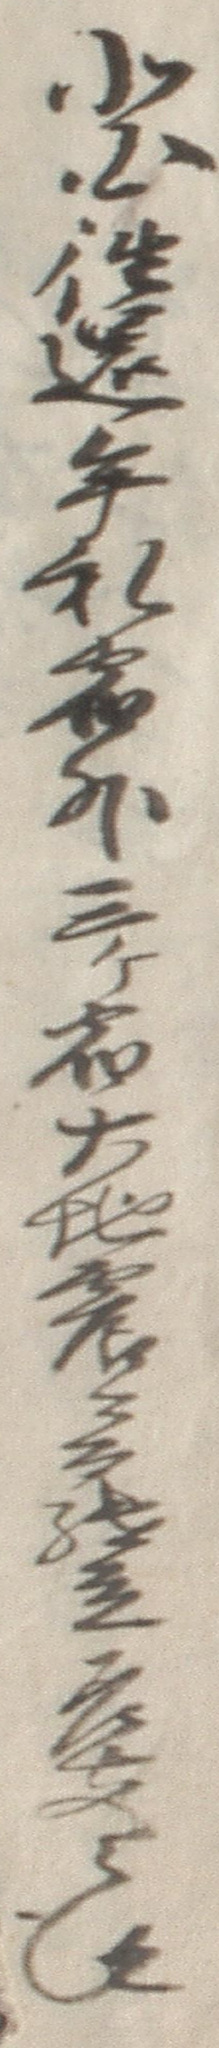北国往還牟礼宿外三ヶ宿大地震二而継立差支候趣
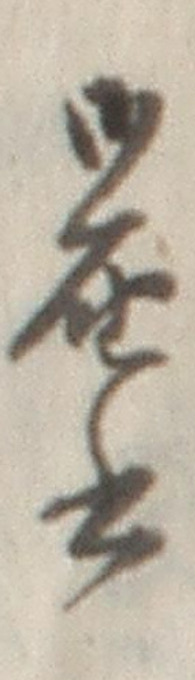御届書
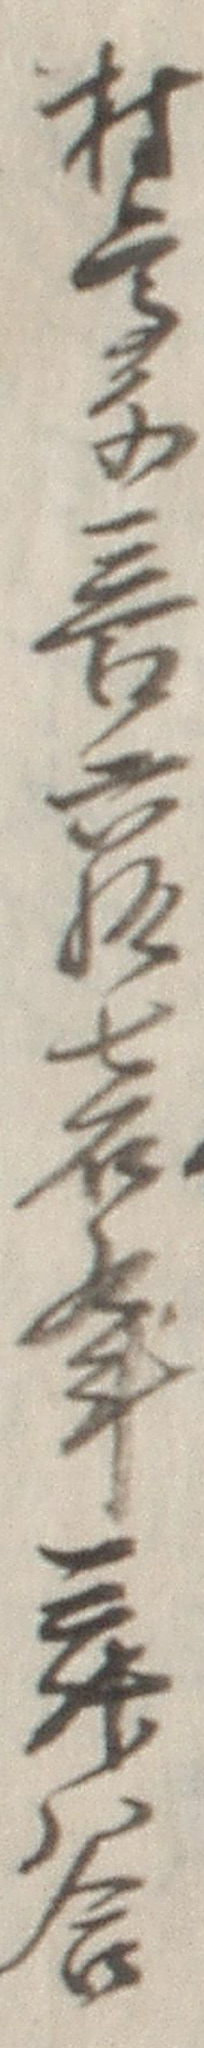村高千三百六拾七石九斗三升八合

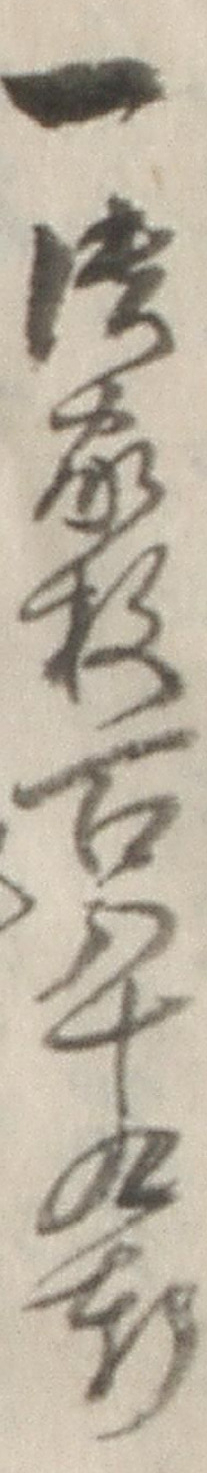一潰家数百五拾四軒
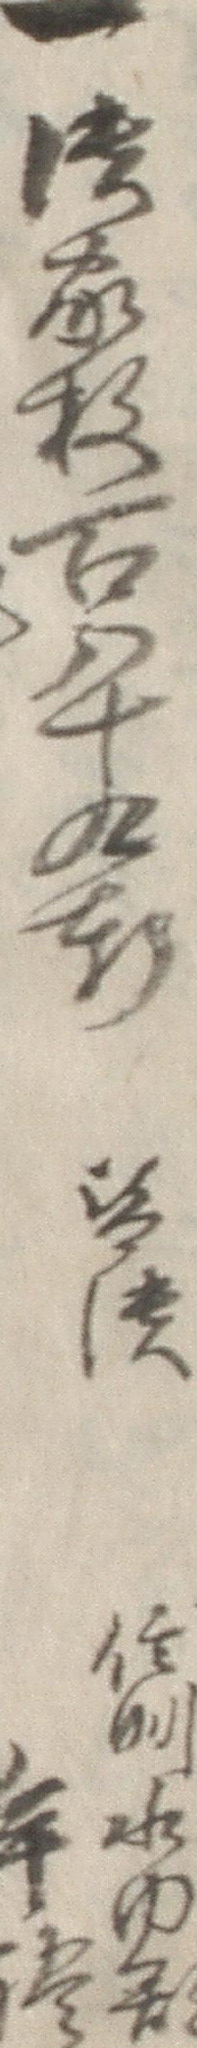一潰家数百八十九軒皆潰信州水内郡
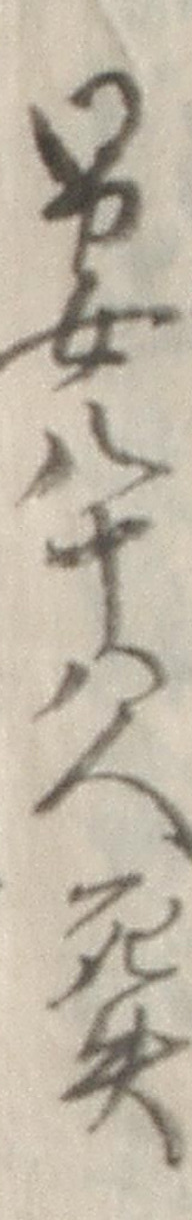男女八十八人死失
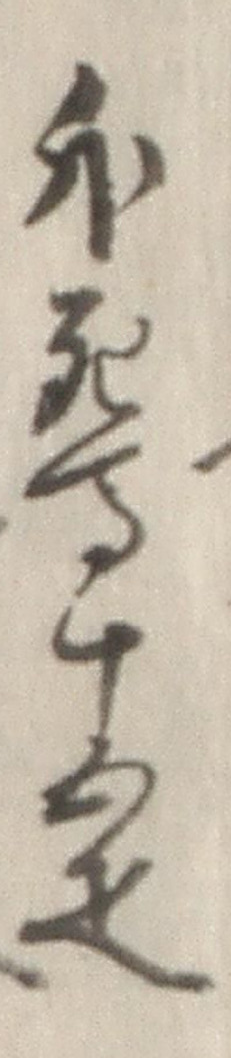外死馬十五疋
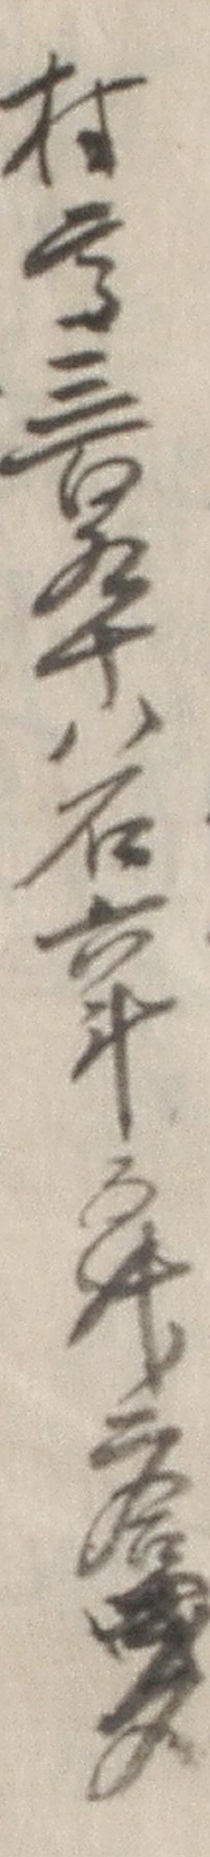村高三百九十八石六斗五升二合四夕
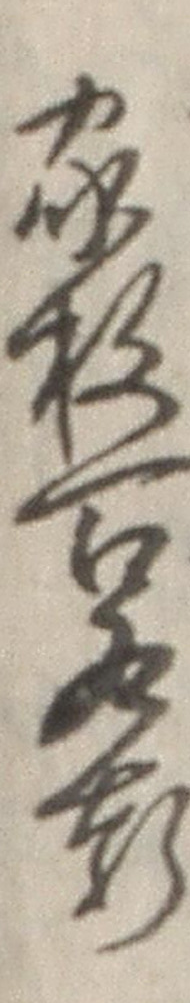家数百九軒
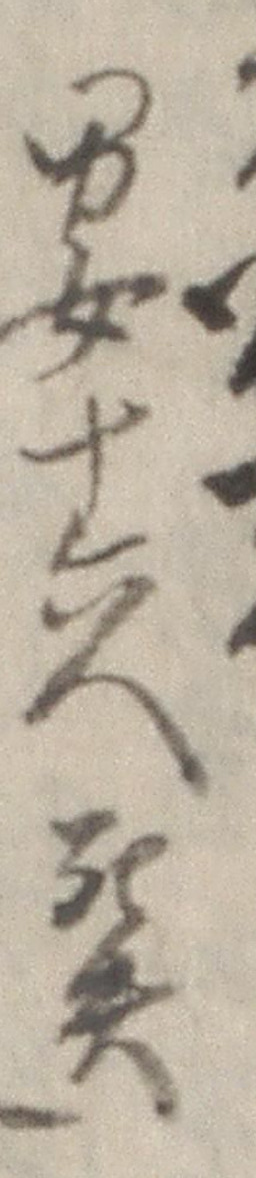男女十七人死失
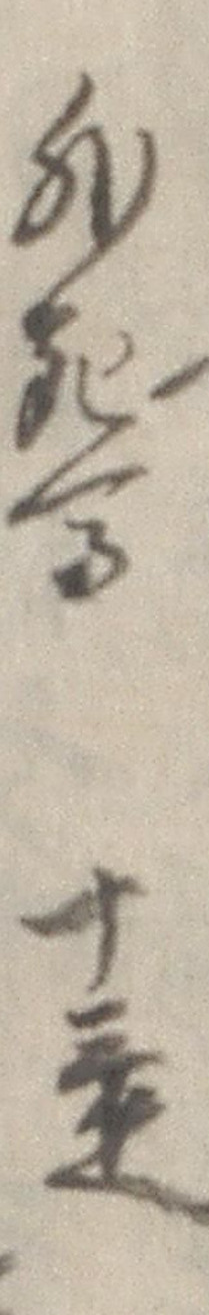外死馬十五疋
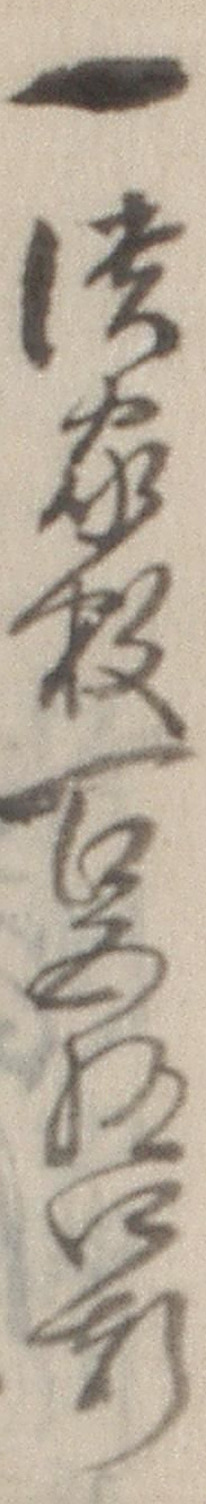一潰家数百五拾四軒
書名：信州地震一件
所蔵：東京大学地震研究所図書室 Earthquake Research Institute Library, The University of Tokyo, JAPAN
